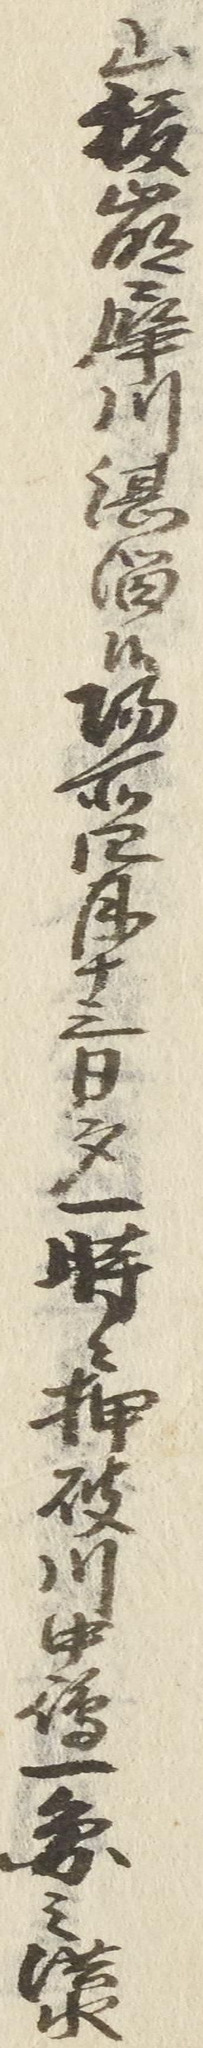山抜崩犀川湛留候場所四月十三日夕一時二押破川中嶋一円之洪水
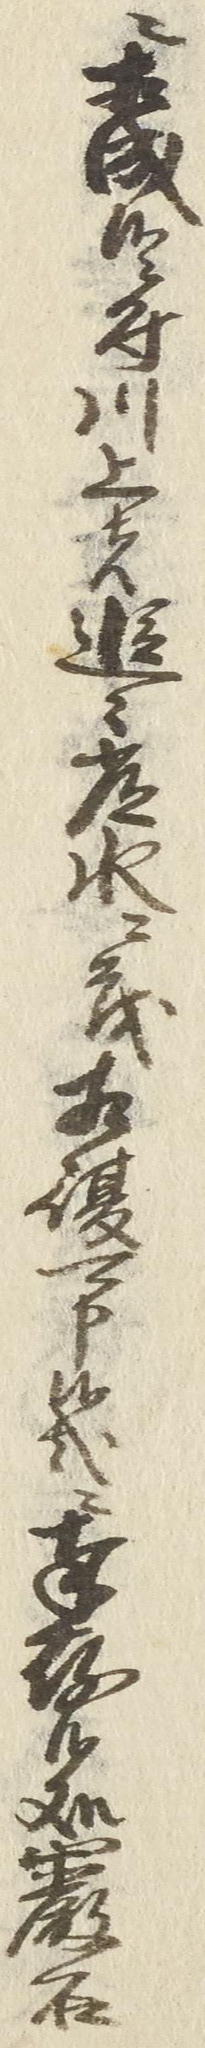二相成候二付川上は追々常水二も相復可申候哉二奉存候処巖石
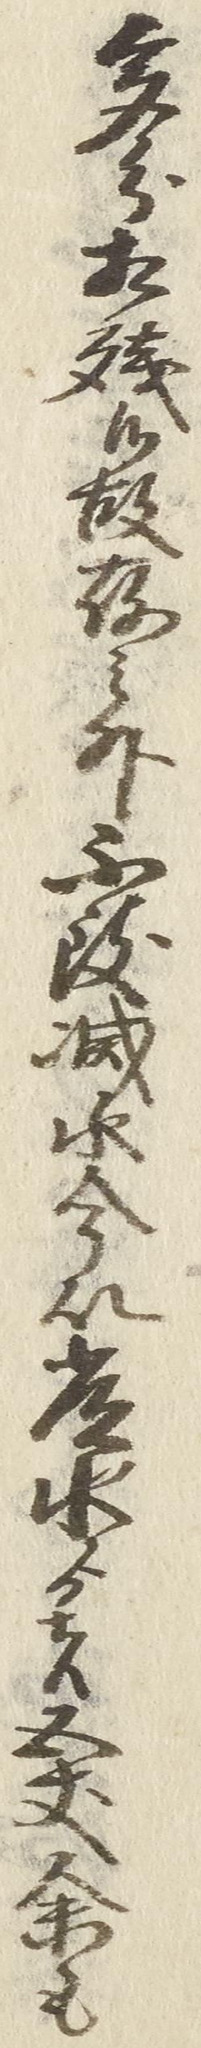多分相残候故存之外不致減水今以常水ゟは五丈余も
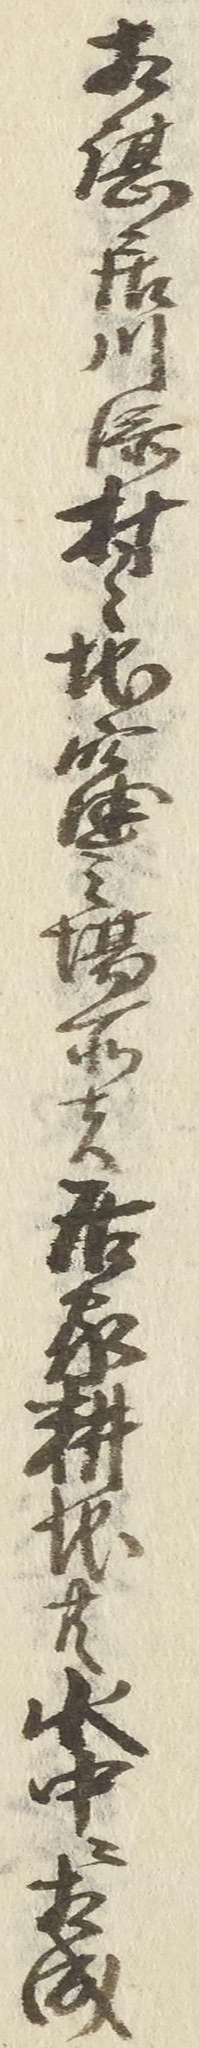相湛居川添村々地窪之場所は居家耕地共水中二相成
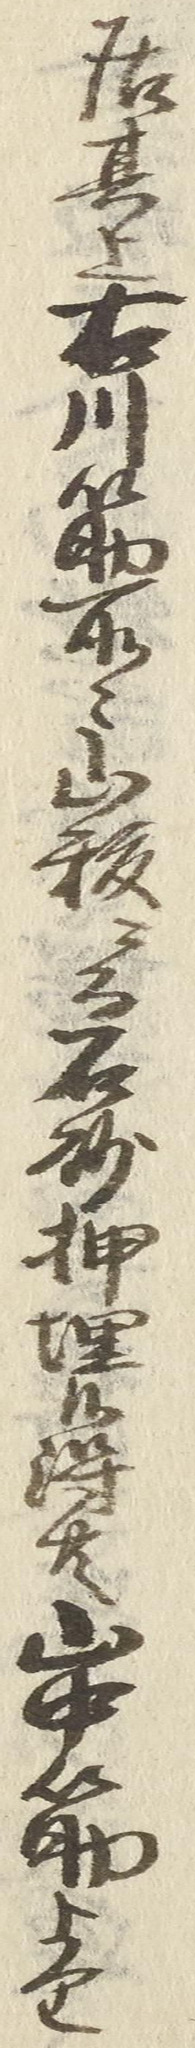居其上右川筋所々山抜二而石砂押埋候得共山中筋より
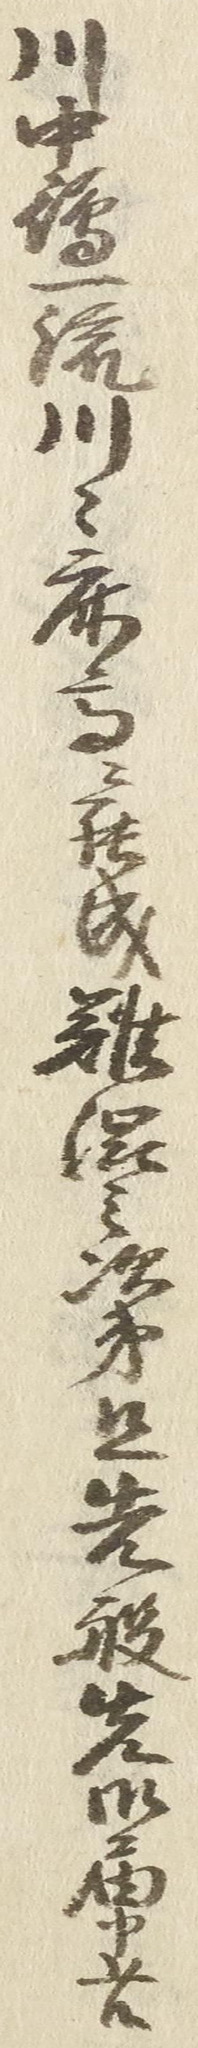川中嶋一流川々床高罷成難渋之次第且先般先御届申上候
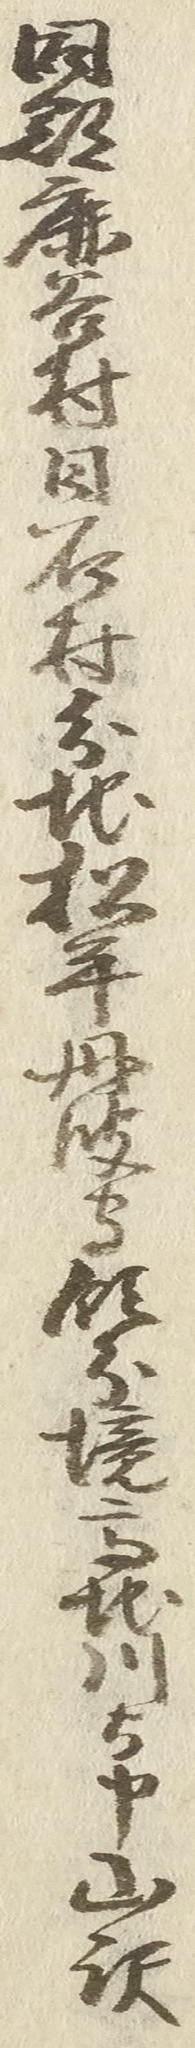同郡鹿谷村日名村分地松平丹波守領分境高地川と申山沢
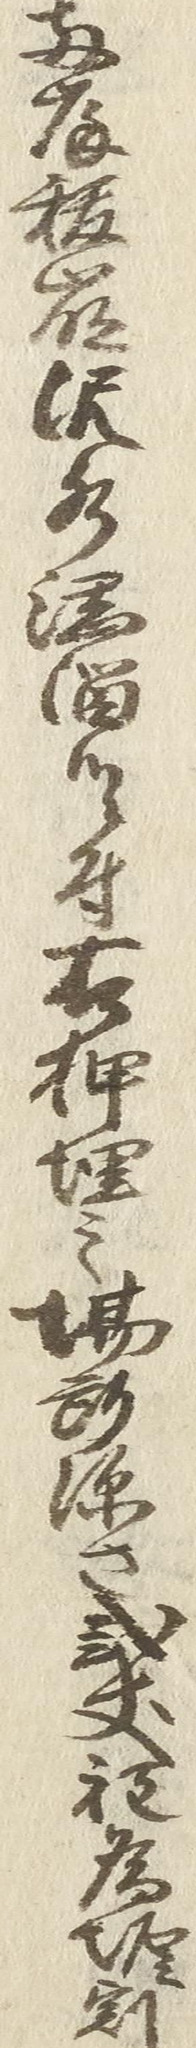両岸抜落沢水湛留候二付右押埋之場所深さ弐丈程為堀割
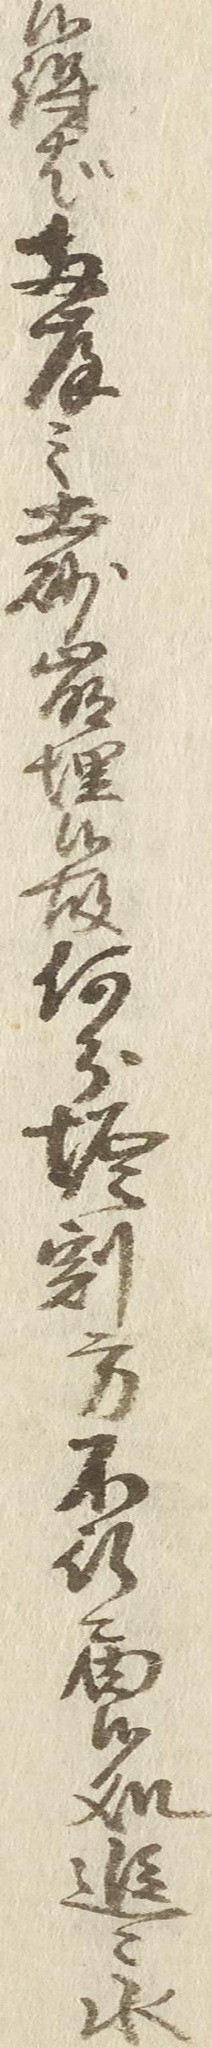候得共両岸之土砂崩埋候故何分堀割方不行届候処追々水
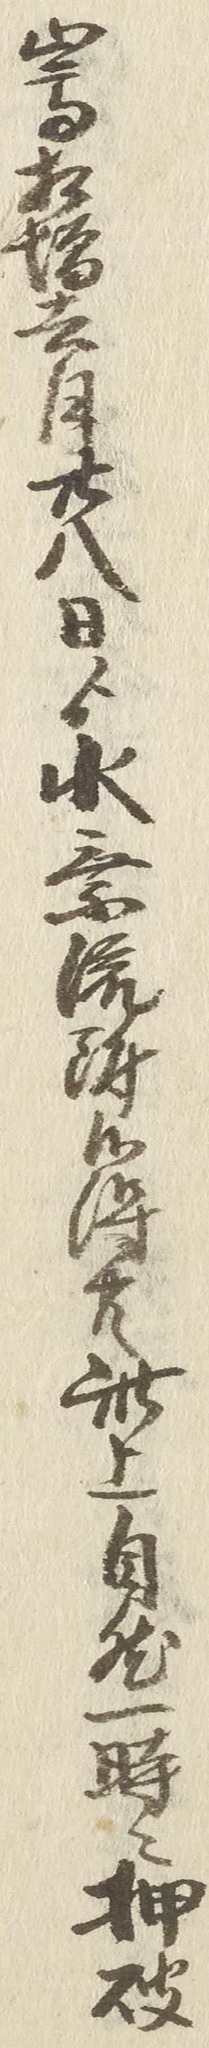嵩相増去月廿八日ゟ水乗流附候得共此上自然一時二押破
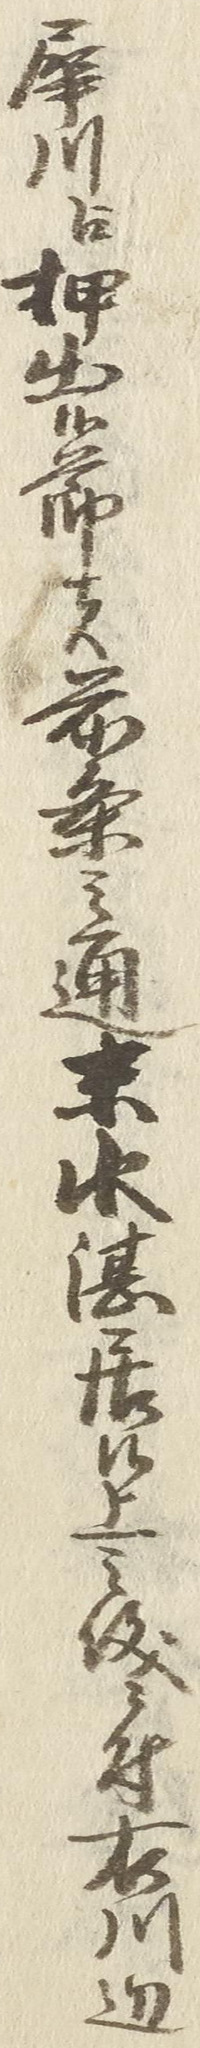犀川江押出候節は前条之通未水湛居候上之儀二付右川辺
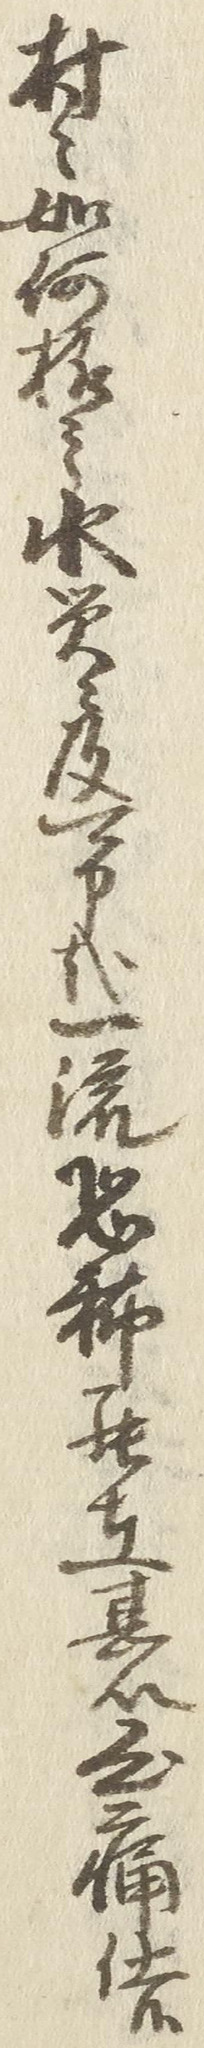村々如何様之水災二及可申哉一流恐怖罷在其以心痛仕候
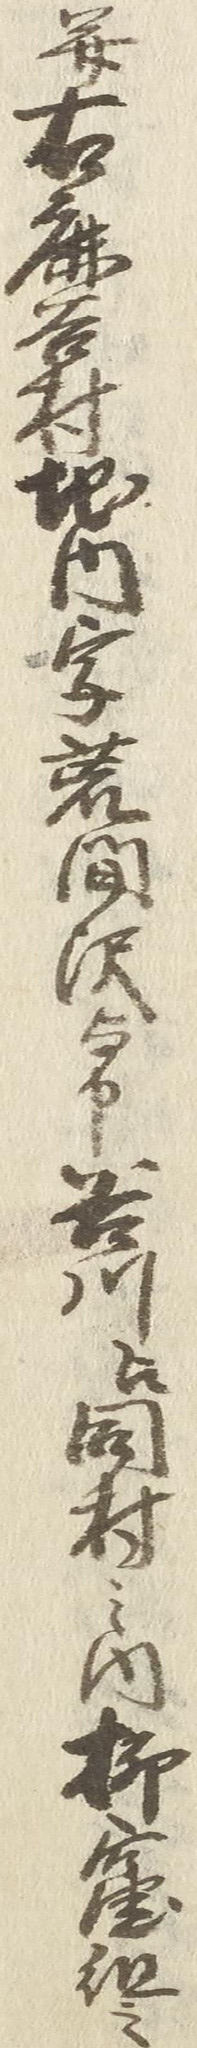并右鹿谷村地内字荒間沢と申谷川江同村之内柳窪組之
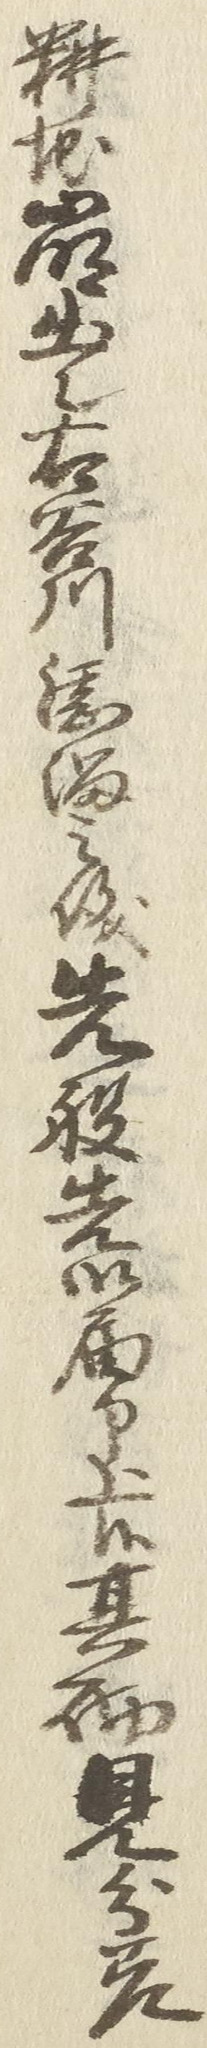耕地崩出し右谷川湛留之儀先般先御届申上侯其砌見分差
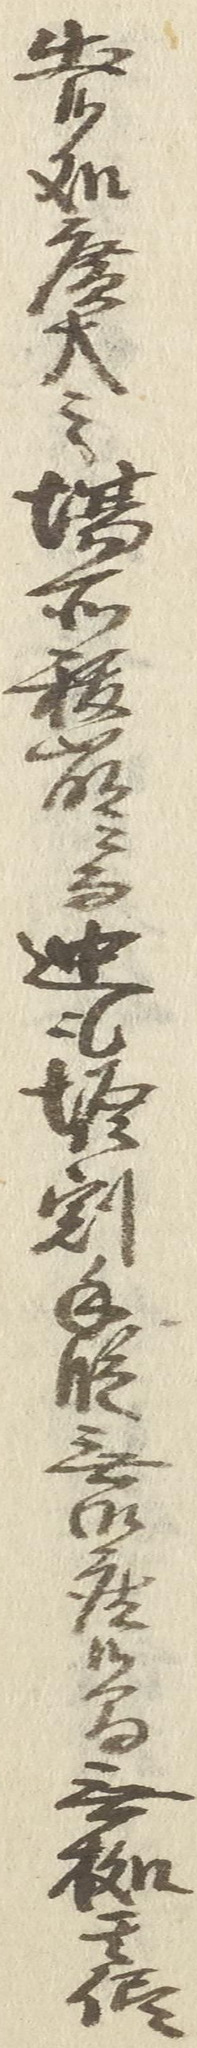出候処廣大之場所抜崩二而迚も堀割手段無御座候間無拠其儘

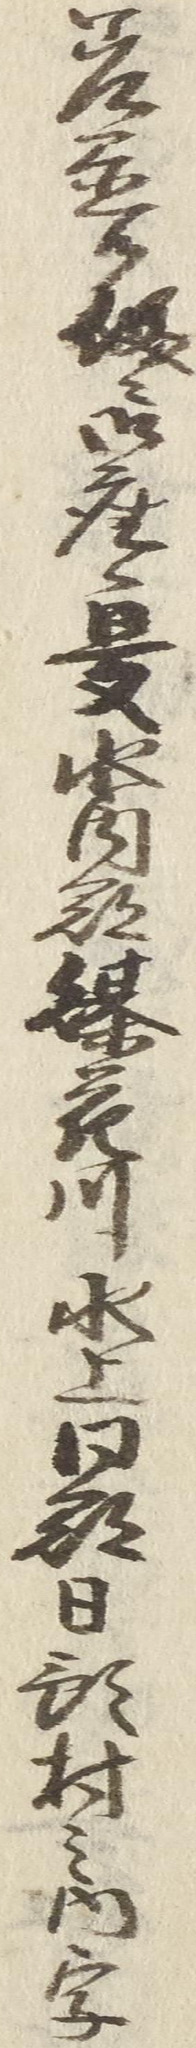差置候儀ニ御座候且又水内郡煤花川水上同郡日影村之内字
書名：従往古地震御届書記誌之一
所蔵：東京大学地震研究所図書室 Earthquake Research Institute Library, The University of Tokyo, JAPAN
